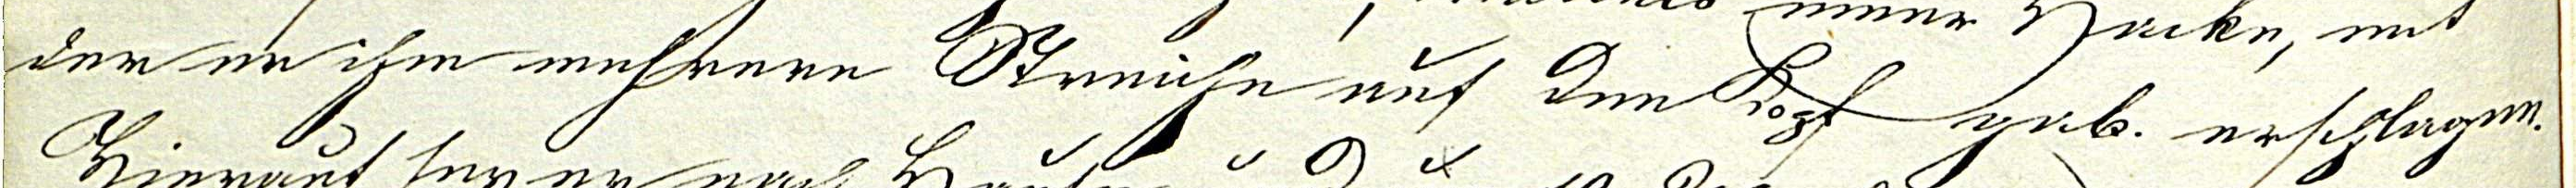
der er ihm mehrere Streiche auf den Kopf gab erschlagen.
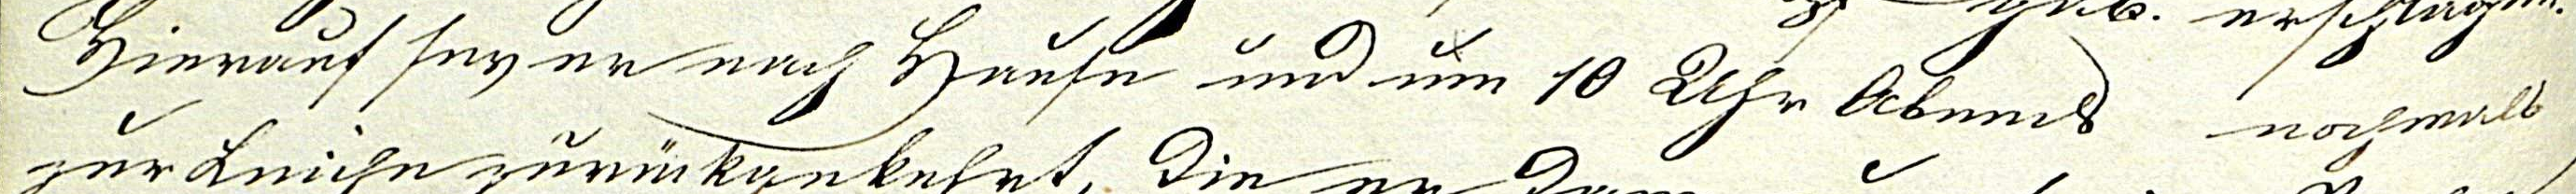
Hierauf sey er nach Hause und um 10 Uhr Abends nochmals
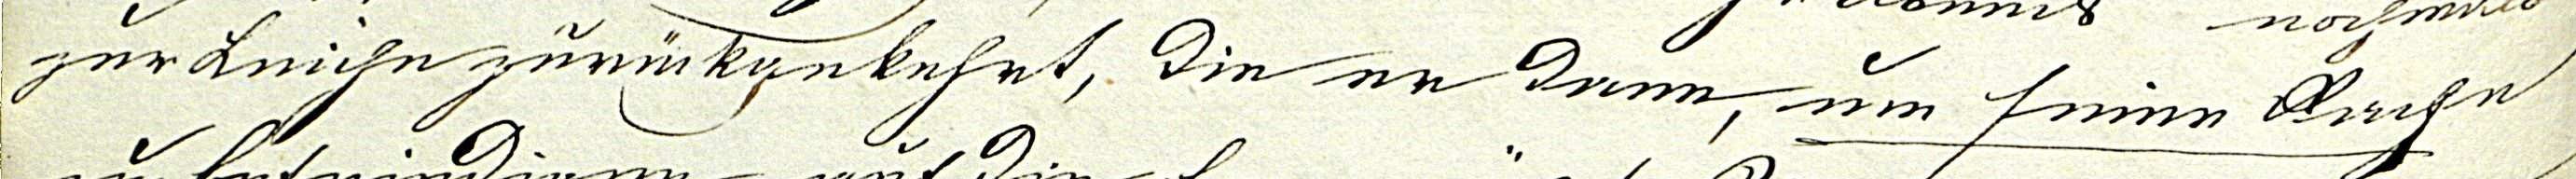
zur Leiche zurückgekehrt, die er dann, um seine Rache
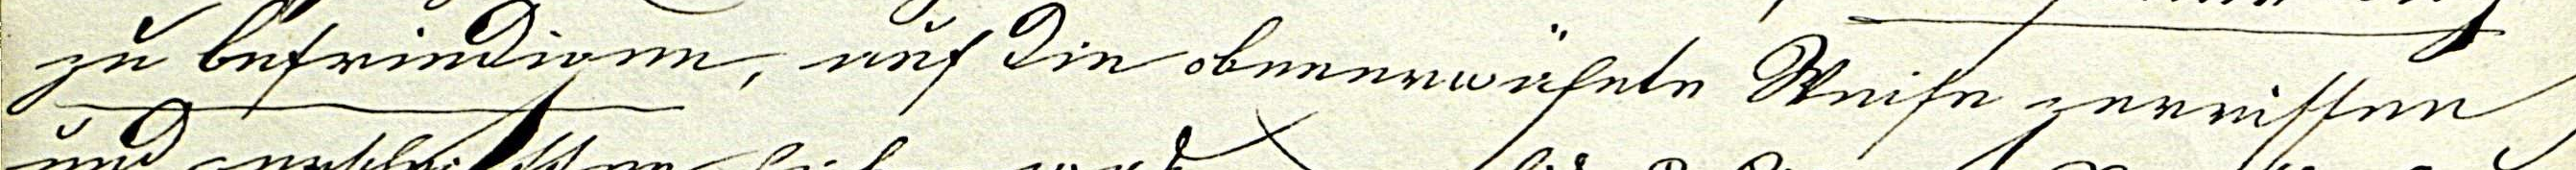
zu befriedigen, auf die obenerwähnte Weise zerrissen
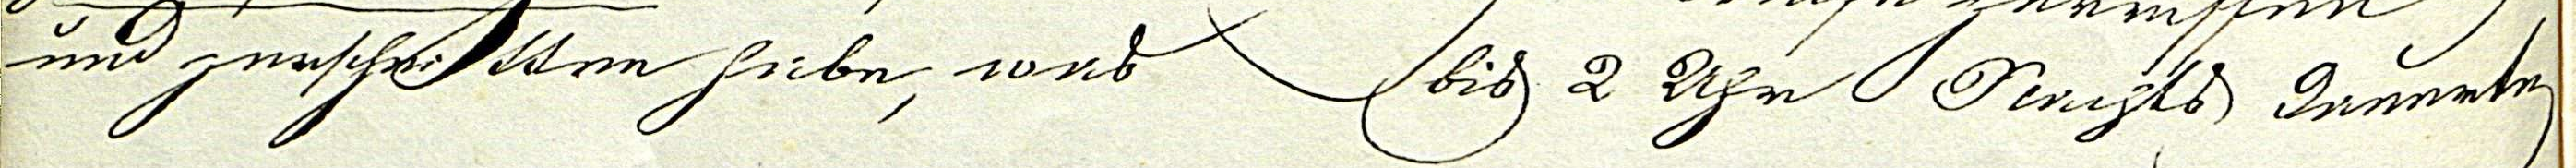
und zerschnitten habe, was bis 2 Uhr Nachts dauerte.
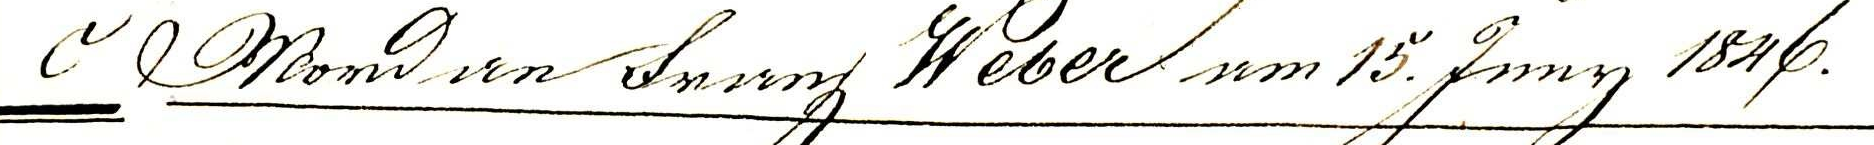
c. Mord an Franz Weber am 15. Juny 1846
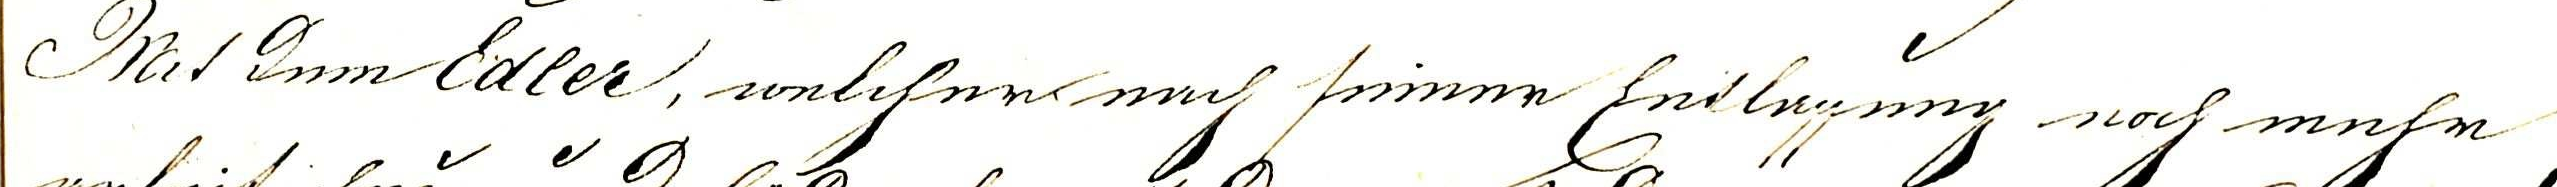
Mit dem Edler, welcher nach seiner Entlassung noch mehr
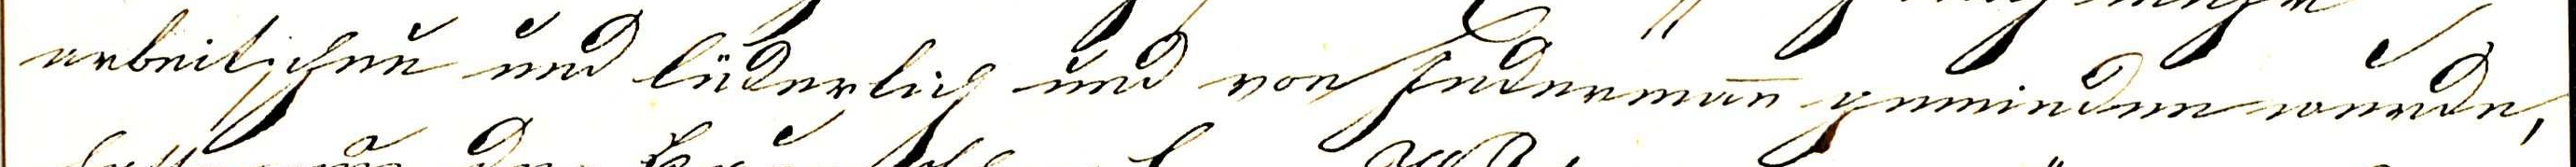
arbeitscheu und lüderlich und von Jedermann gemieden wurde,
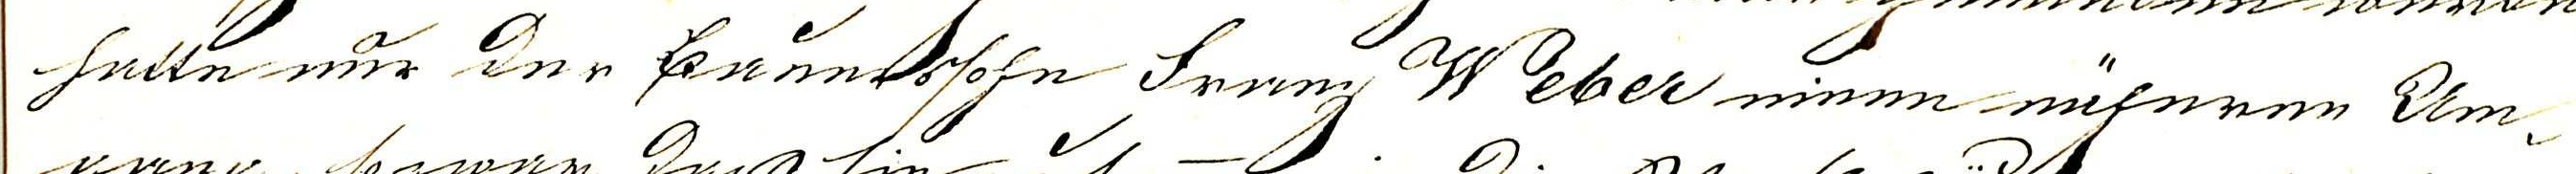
hatte nur der Bauerssohn Franz Weber einen näheren Um¬
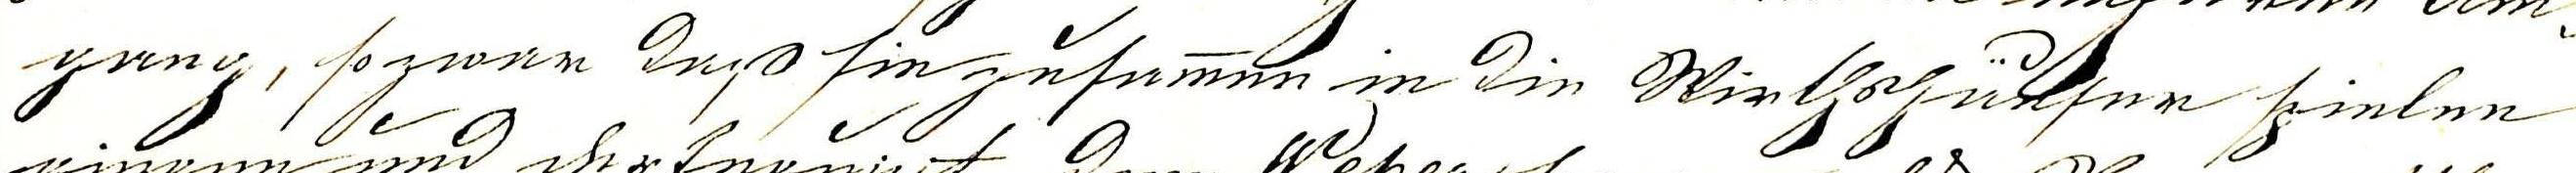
gang, so zwar daß sie zusammen in die Wirthshäuser spielen
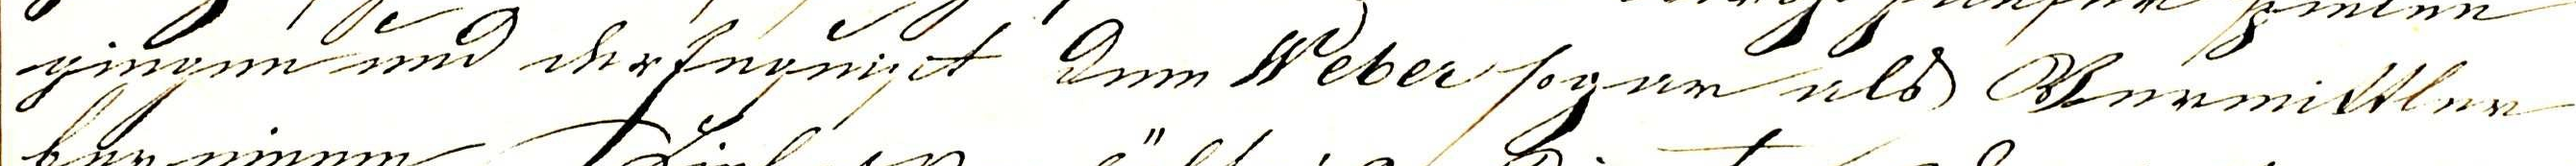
gingen und der Inquisit dem Weber sogar als Vermittler
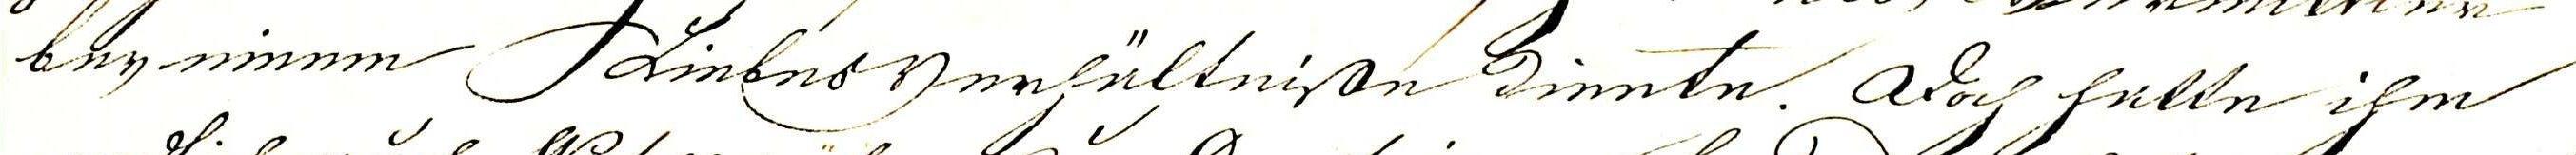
bey einem Liebesverhältniße diente. Doch hatte ihm
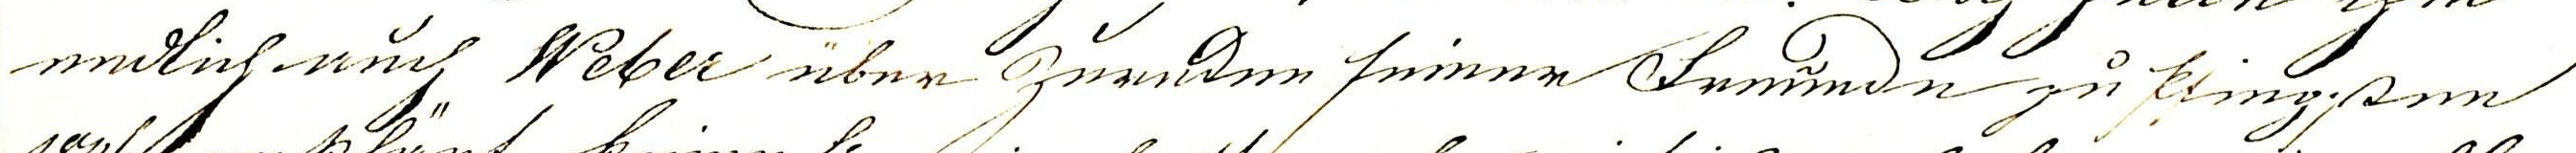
endlich auch Weber über Zureden seiner Freunden zu Pfingsten
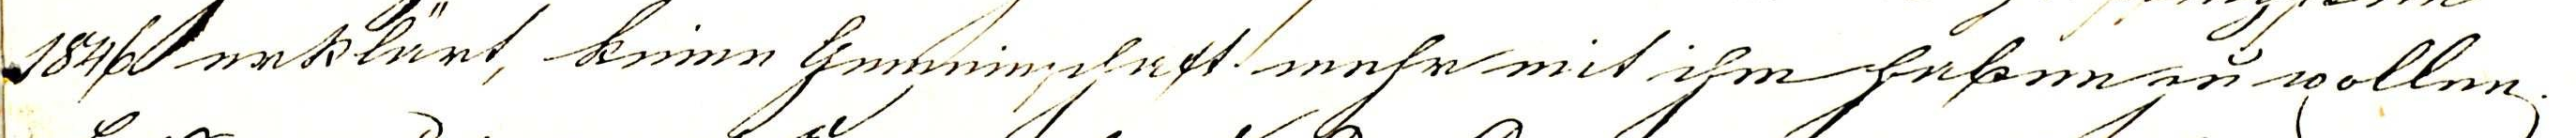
1846 erklärt, keine Gemeinschaft mehr mit ihm haben zu wollen.
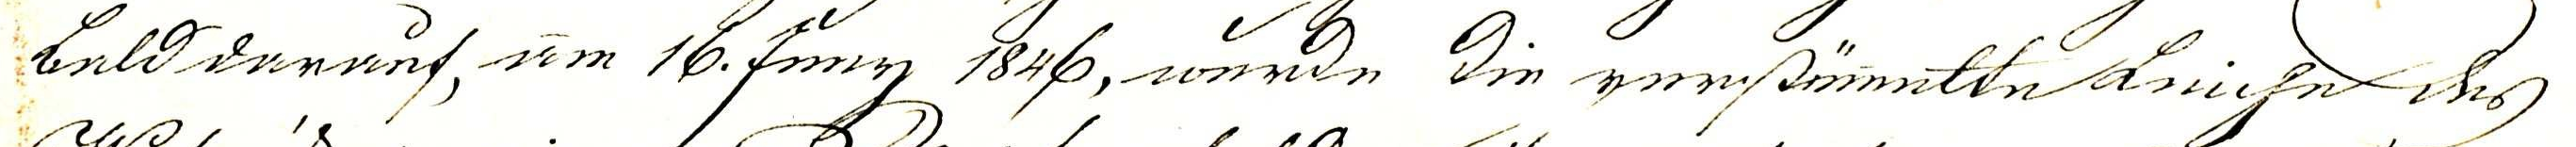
Bald darauf, am 16. Juny 1846, wurde die verstümmelte Leiche des
